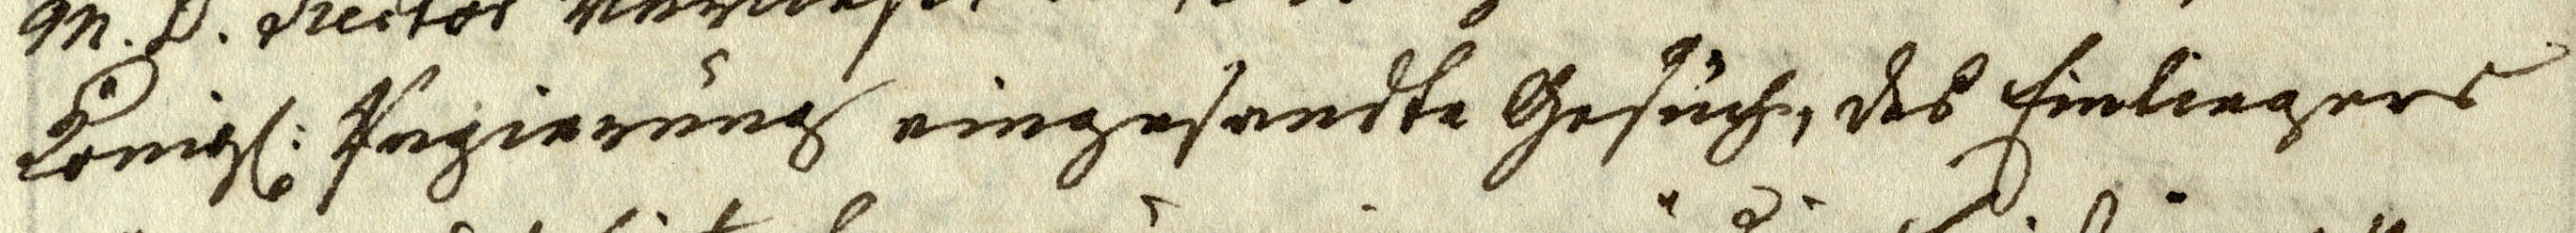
Königl. Regierung eingesandte Gesuch, des Einliegers
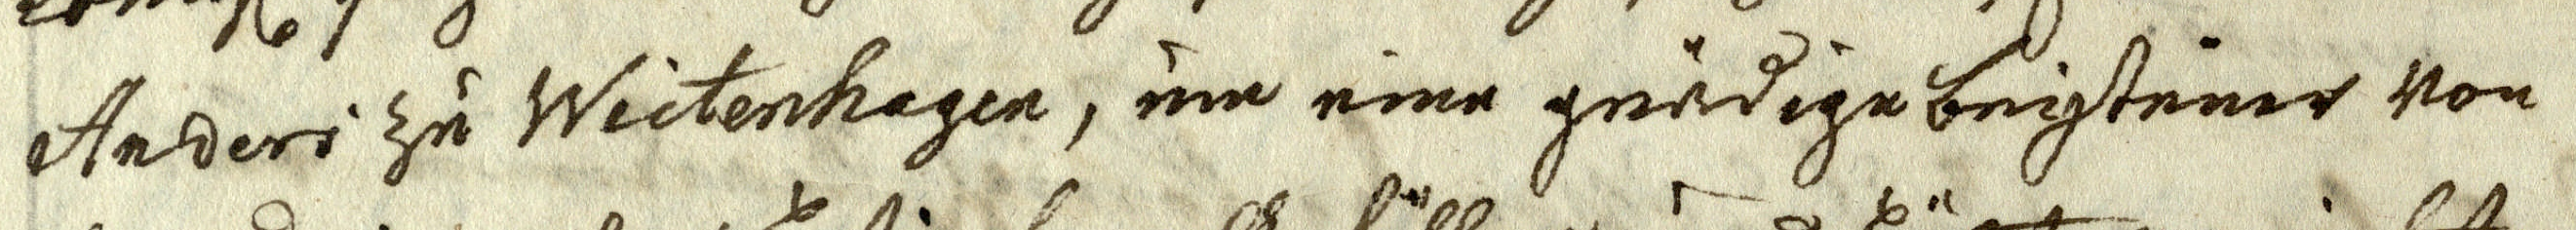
Anders zu Weitenhagen, um eine gnädige Beÿsteuer von
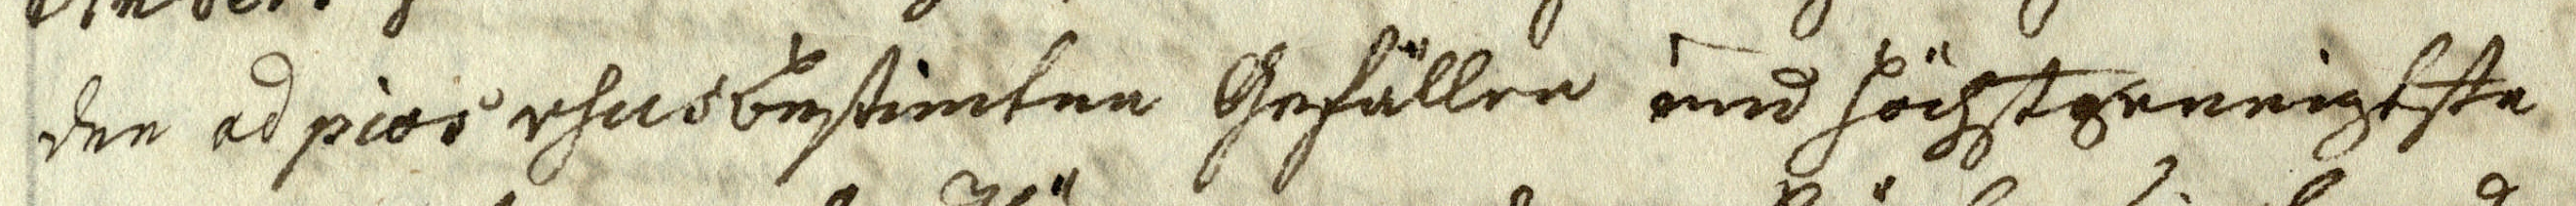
den ad pios ehus bestimten Gefällen und höchstgeneigteste
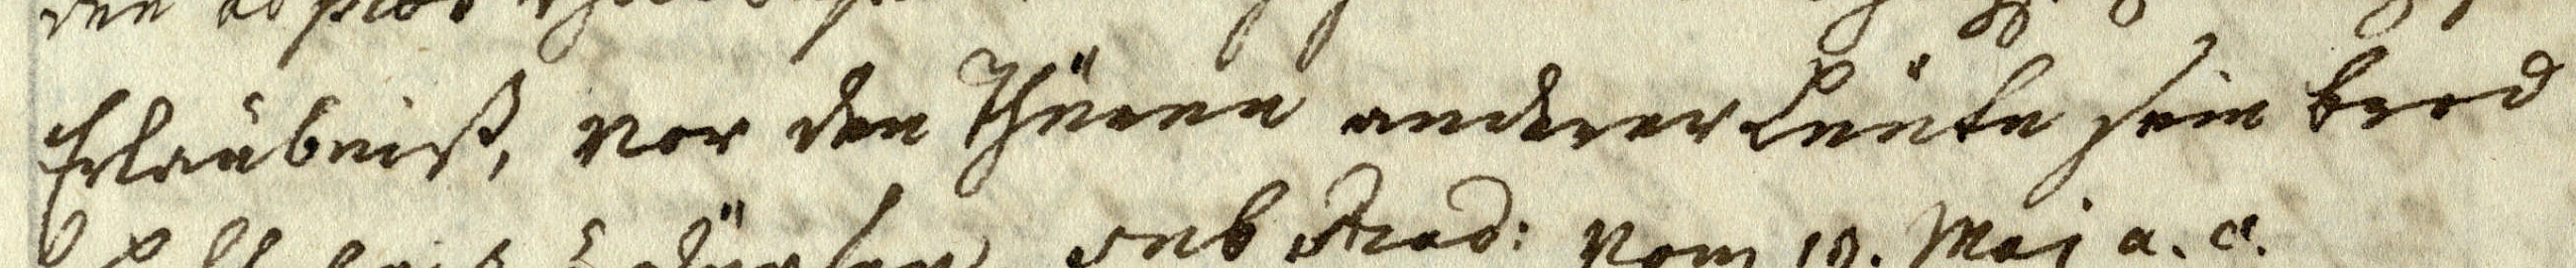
Erlaubniß, vor den Thüren anderer Leute sein Brod
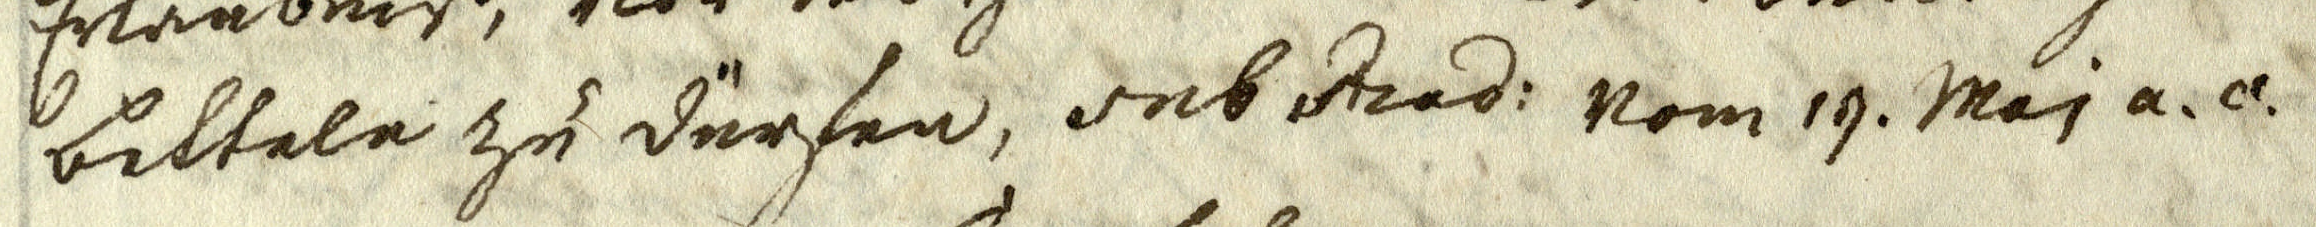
betteln zu dürfen, sub Prad. vom 19. Maj a. c.
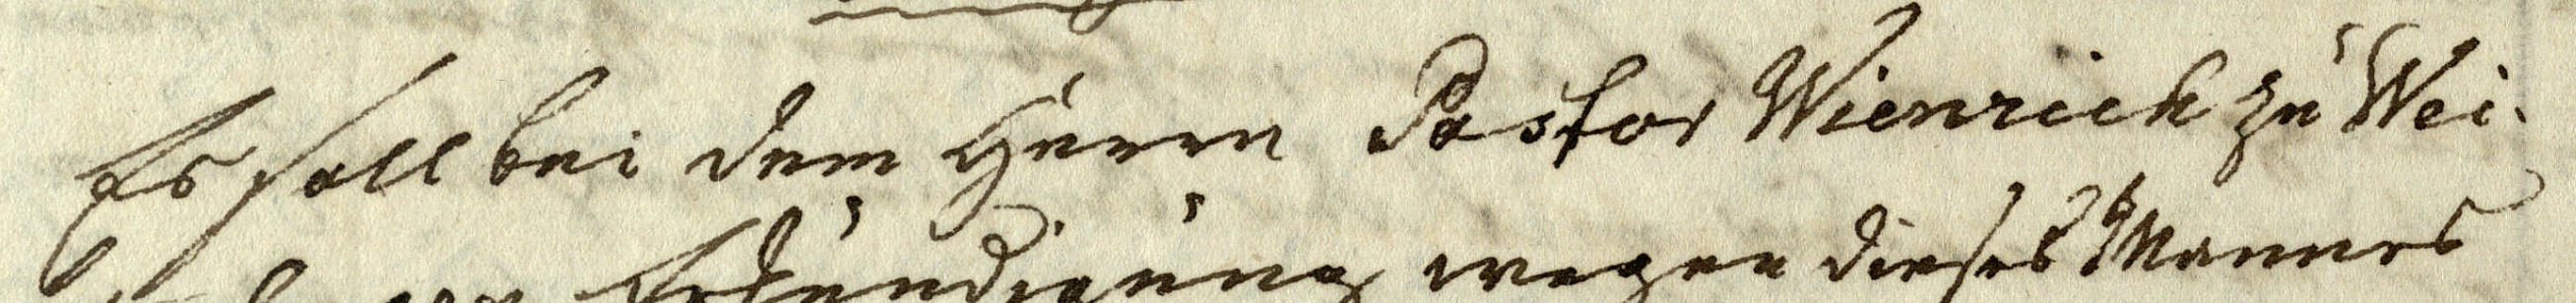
Es soll bei dem Herrn Pastor Wienrich zu Wei¬
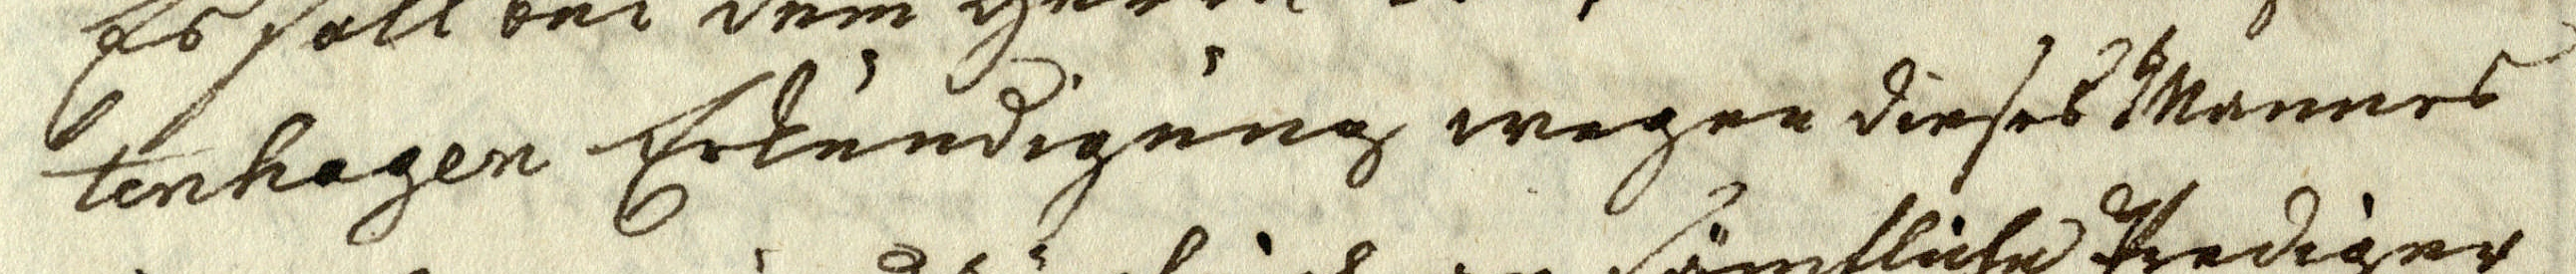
tenhagen Erkundigung wegen dieses Mannes
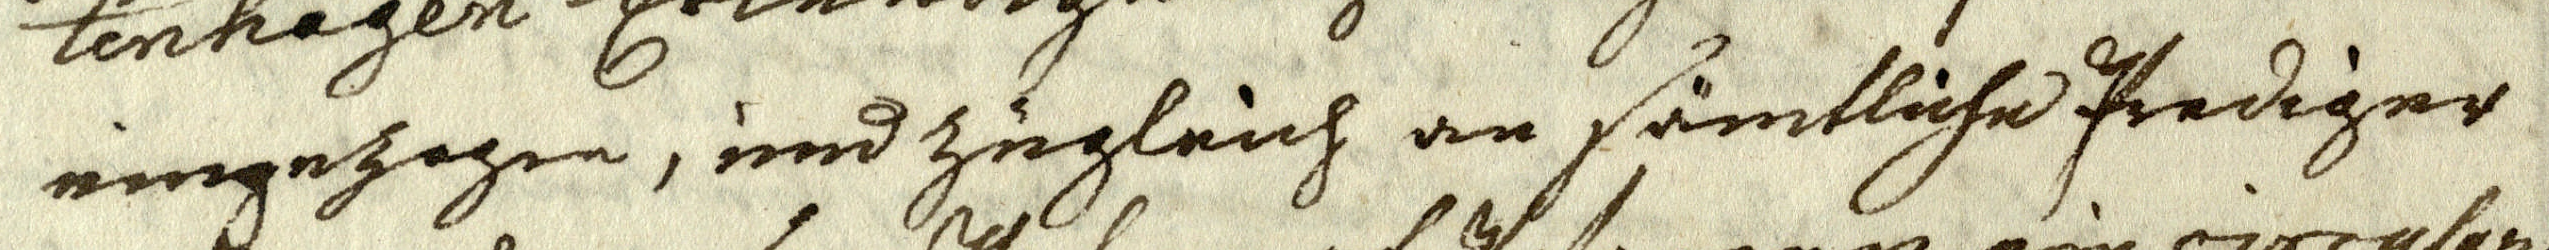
eingezogen, und zugleich an sämtliche Prediger
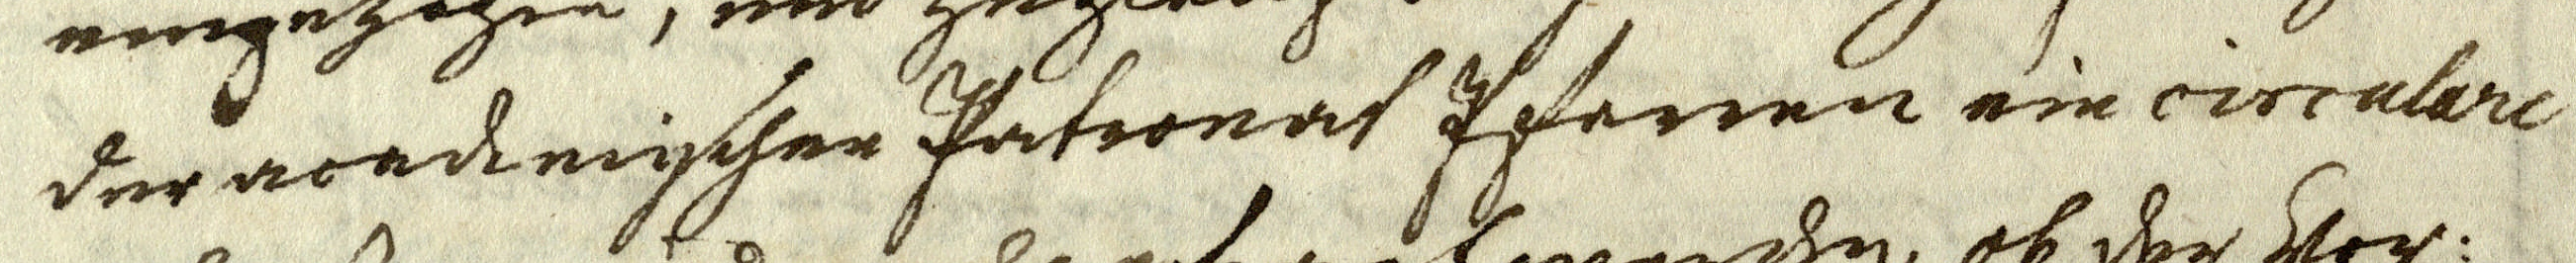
der academischen Patronat Pfarren ein circulare
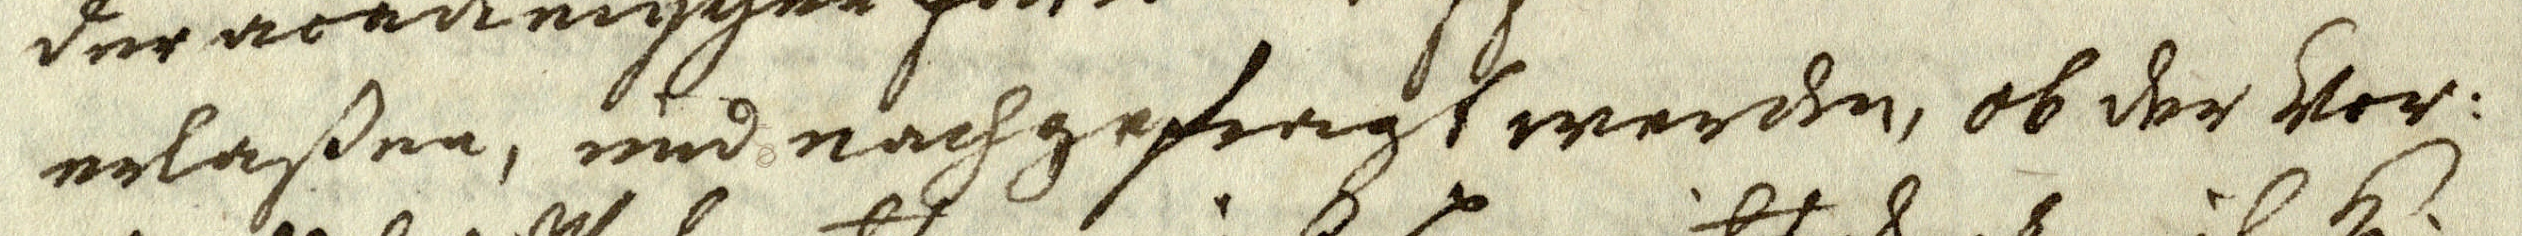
erlaßen, und nachgefragt werden, ob der Vor¬
